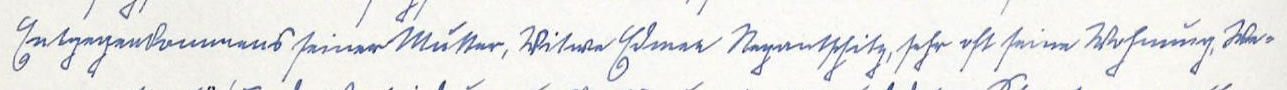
Entgegenkommens seiner Mutter, Witwe Edmer Stegantschitz, sehr oft seine Wohnung, Wie-
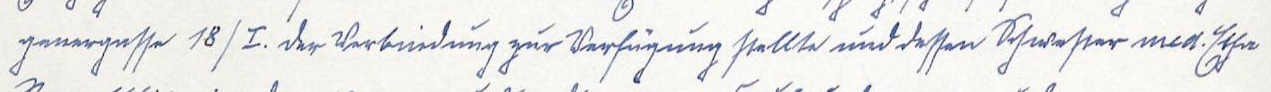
genergase 18/I. der Verbindung zur Verfügung stellte und dessen Schwester med Etha
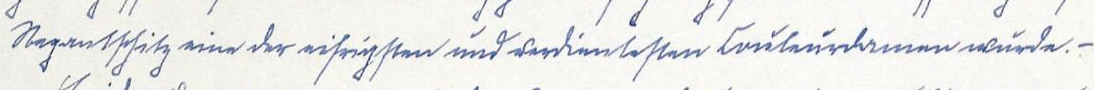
Stegantschitz eine der eifrigsten und verdientesten Couleurdamen wurde.-
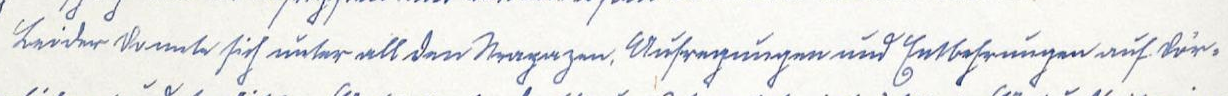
Leider konnte sich unter all den Strapazen, Aufregungen und Entbehrungen auf kör-
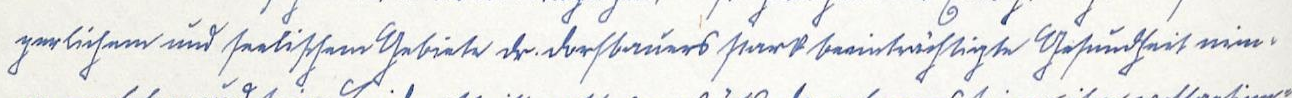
perlichem und seelischem Gebiete Dr. Dorfbauers stark beinträchtigte Gesundheit nim-
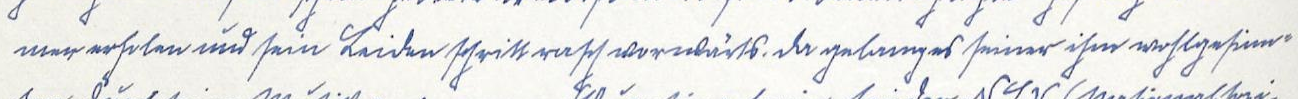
mer erholen und sein Leiden schritt rasch vorwärts. Da gelanges seiner ihm wohlgesinn-
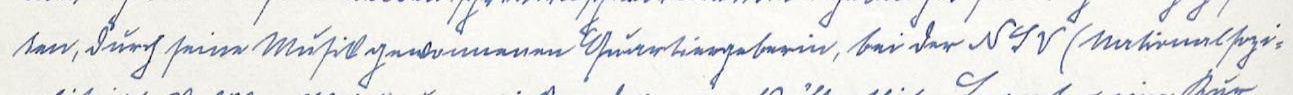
ten, durch seine Musik gewonnenen Quartiergeberin, bei der NSV (Nationalsozi-
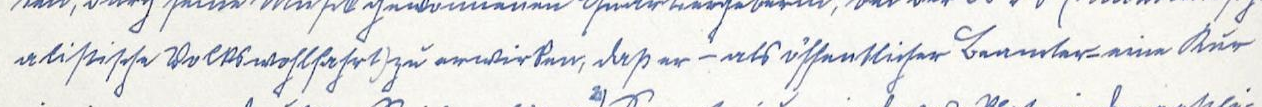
alistische Volkswohlfahrt), zu erwirken, dass er - als öffentlicher Beamter eine Kur
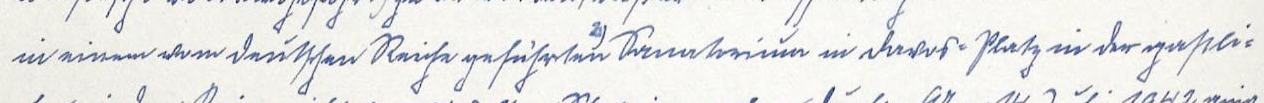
in einem vom deutschen Reiche geführten Sanatorium in Davos- Platz in der gastli-
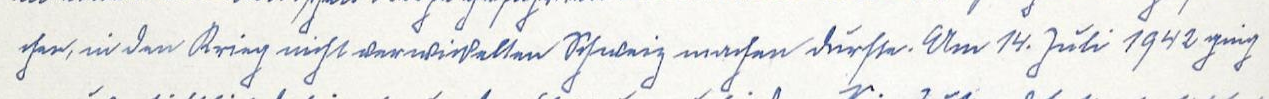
chen, in den Krieg nicht verwickelten Schweiz - machen durfte. Am 14. Juli 1942 ging
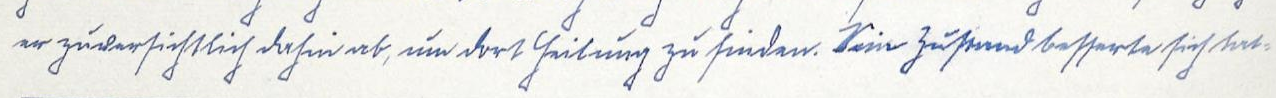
er zuversichtlich dahin ab, um dort Heilung zu finden. Sein Zustand bessere sich tat-
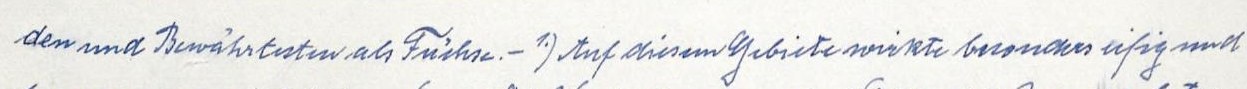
den und Bewährtesten als Füchse.- 1) Auf diesem Gebiete wirkte besonders eifrig und
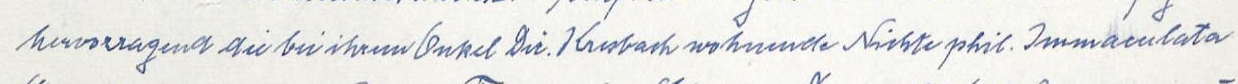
hervorragend die bei ihren Onkel Dir. Kresbach wohende Nichte phil. Immaculata
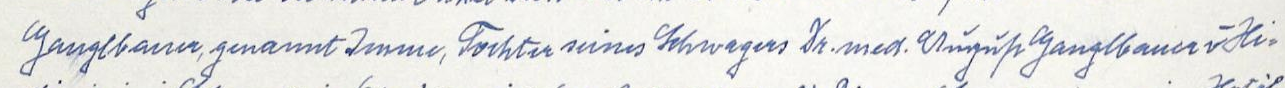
Ganglbaner, genannt Imme, Tochter seines Schwagers Dr. med. August Ganglbaner v/o Hi-
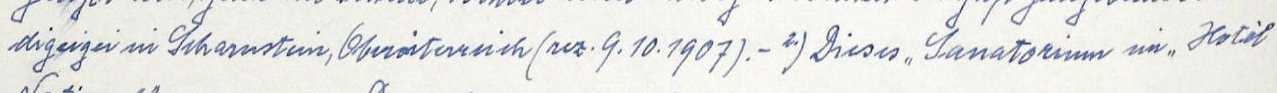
digeigei in Scharnstein, Oberösterreich (rez. 9. 10. 1907).- 2) Dieser "Sanatorium im „Hotel
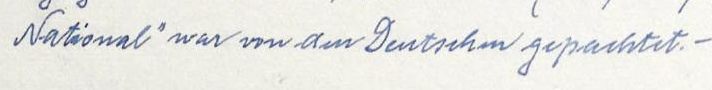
National" war von den deutschen gepachtet.
